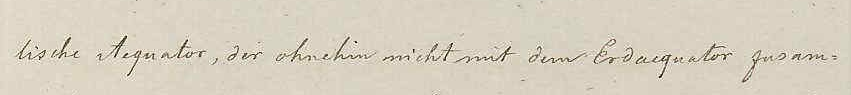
tische Aequator, der ohnehin nicht mit dem Erdaequator zusam-
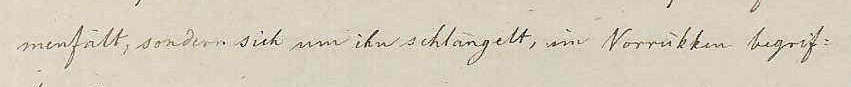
menfält, sondern sich um ihn schlängelt, im Vorrükken begrif
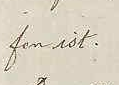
fen ist.
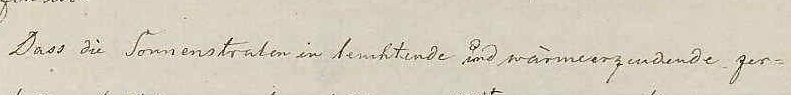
Dass die Sonnenstralen in leuchtende iund wärmeerzeugende zer-
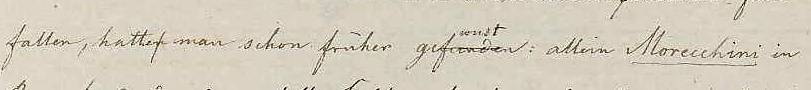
fallen, hatten man schon früher gefundenwust: allein Morecchini in
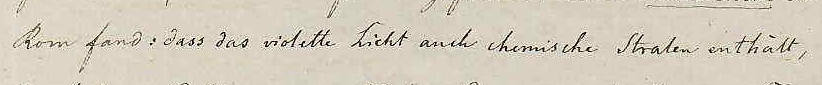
Rom fand: dass das violette Licht auch chemische Stralen enthält,
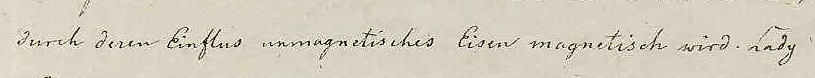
durch deren Einflus unmagnetisches Eisen magnetisch wird. Lady
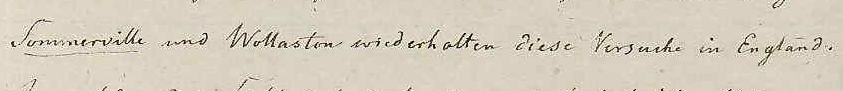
Sommerville und Wollaston wiederholten diese Versuche in England.
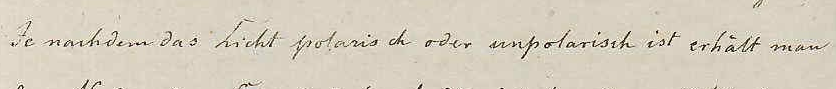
Je nachdem das Licht polarisch oder unpolarisch ist erhält man
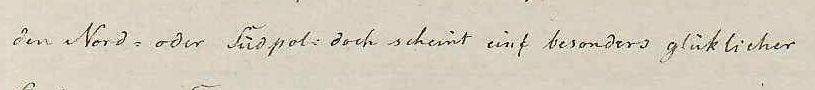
den Nord- oder Südpol: doch scheint eine besonders glüklicher
